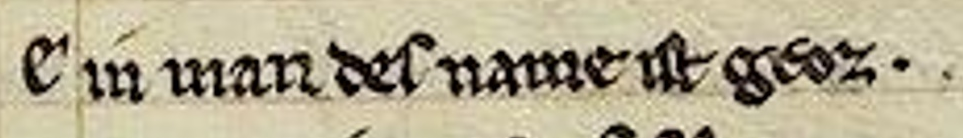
Ein man deſ name iſt groz.
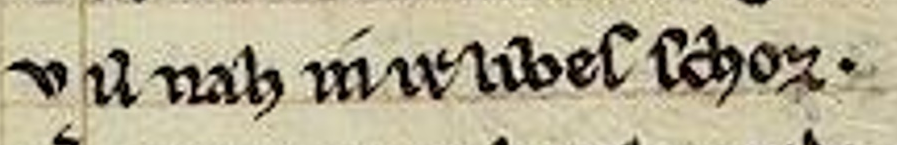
Vil nah in ir libeſ ſchoz.
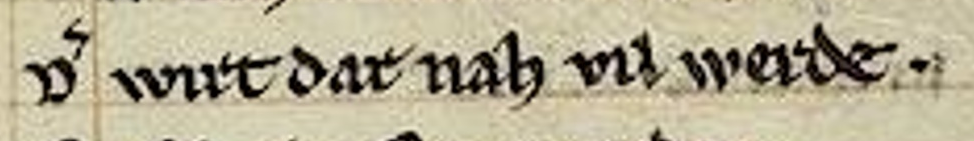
D(er) wirt dar nah vil werde.
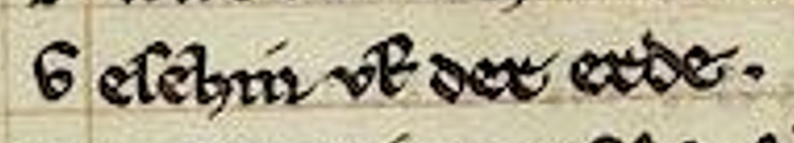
Geſehin vf der erde.
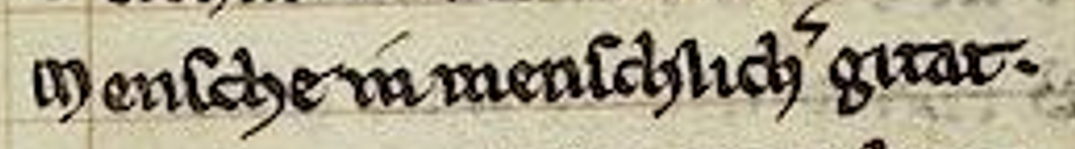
Menſche in menſchlich(er) gitat.
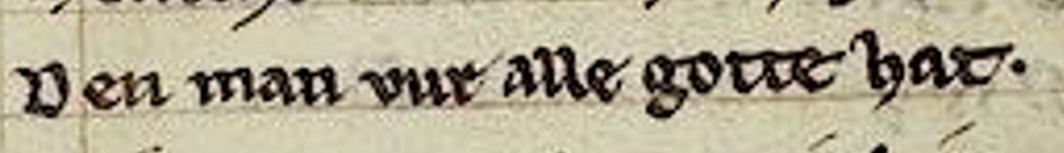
Den man vur alle gotte hat.
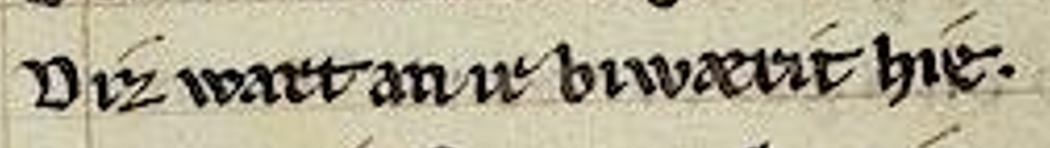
Diz wart an ir biw[ae]rit hie.
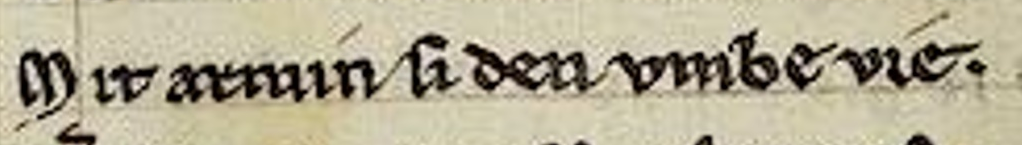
Mit armin ſi den vmbe vie.
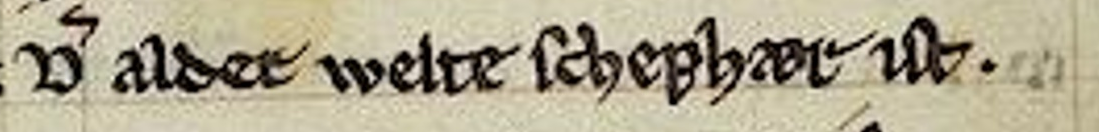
D(er) alder welte ſcheph[ae]r iſt.
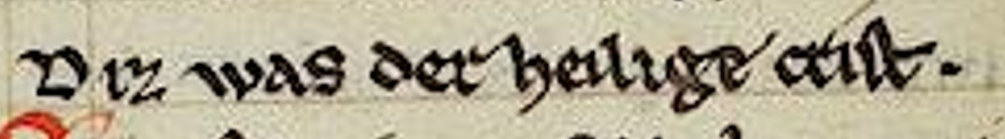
Diz was der heilige criſt.
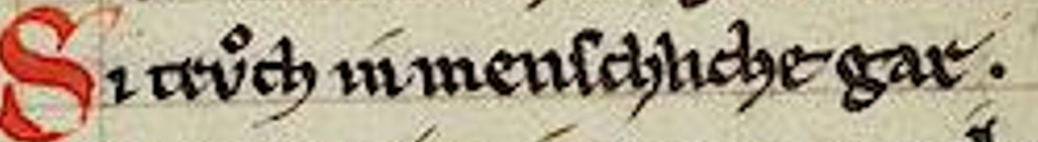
*Si trv°och in menſchliche gar.
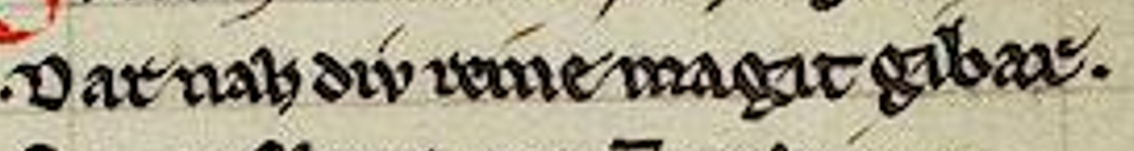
Dar nah div reine magit gibar.
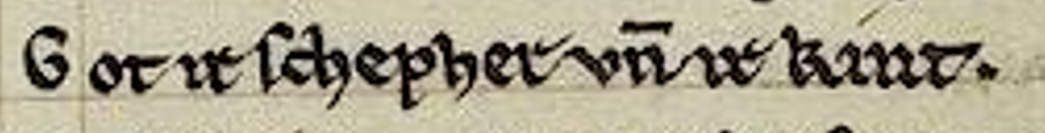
Got ir ſchepher vn(d) ir kint.
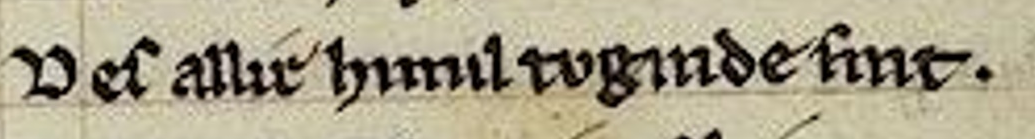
Deſ allir himil tvginde ſint.
